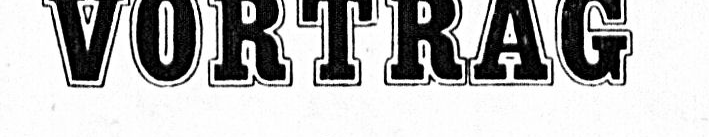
VORTRAG
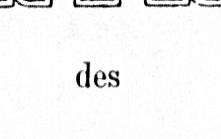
des
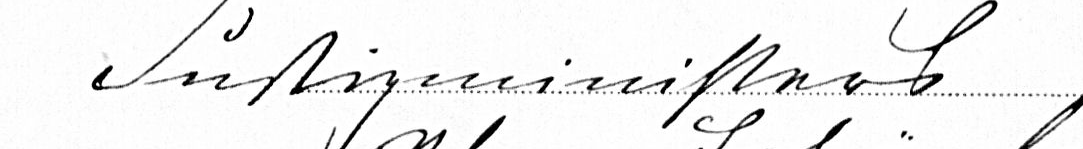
Justizministers
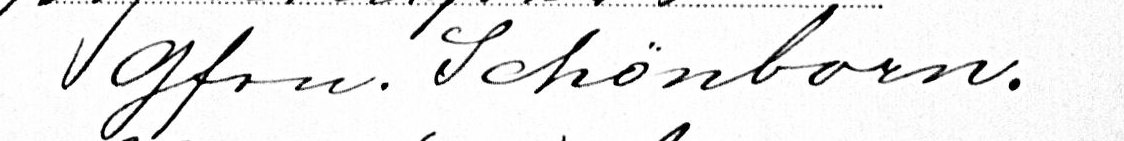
Gfen. Schönborn.
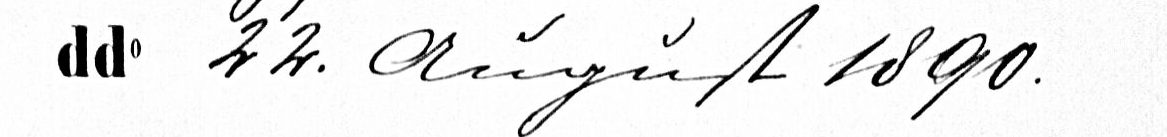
dd° 22. August 1890.
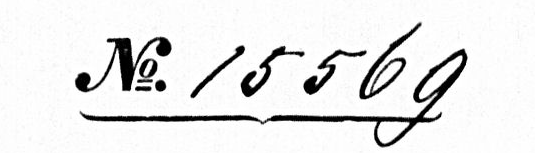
N° 15569
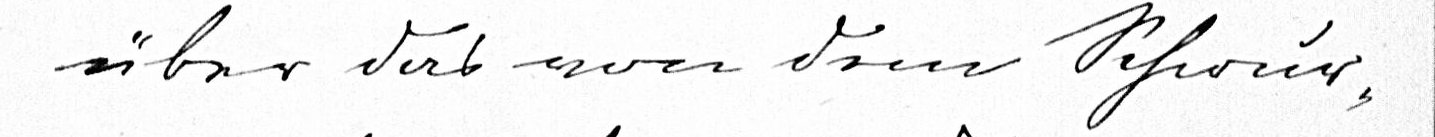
über das von dem Schwur¬
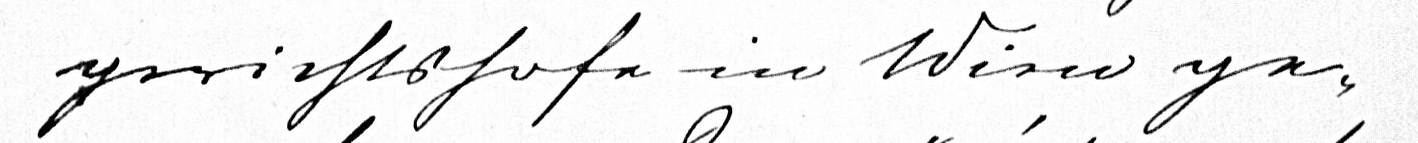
gerichtshofe in Wien ge¬
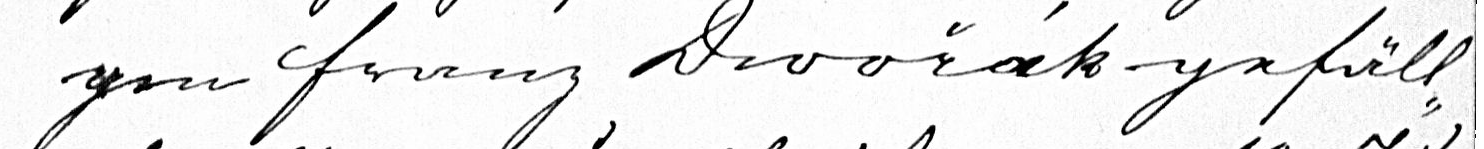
gen Franz Dwořák gefäll¬
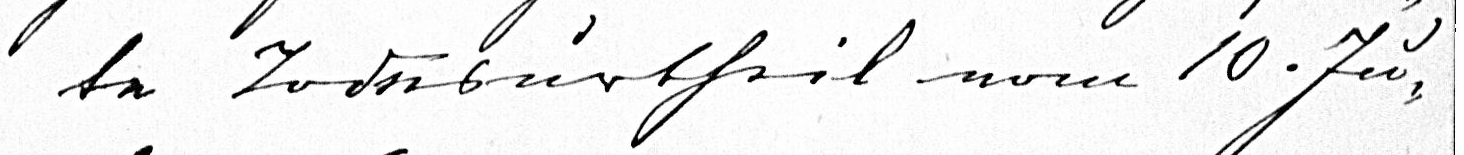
te Todesurtheil vom 10. Ju¬
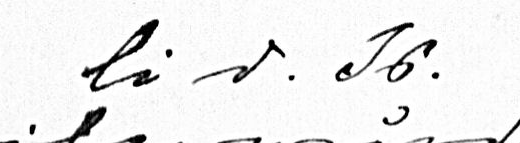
li d. 36.
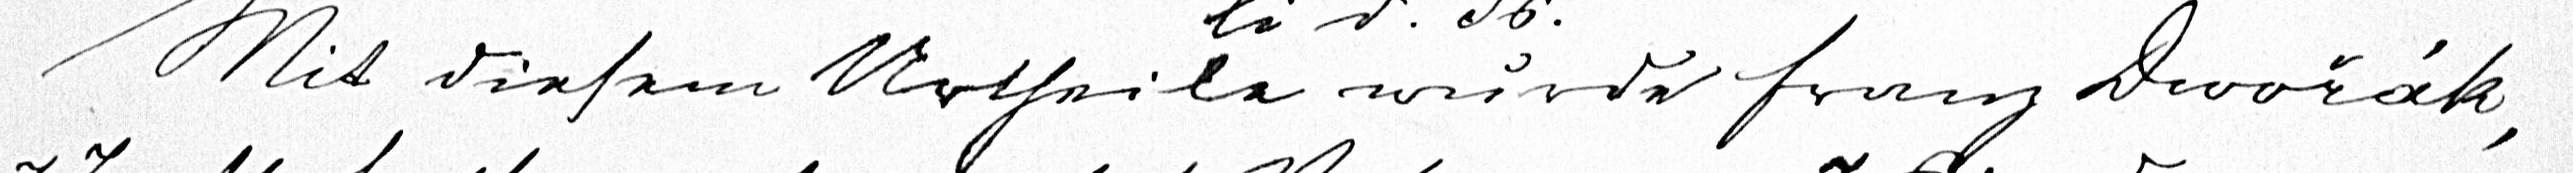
Mit diesem Urtheilte wurde Franz Dwořák,
